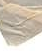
Berlin
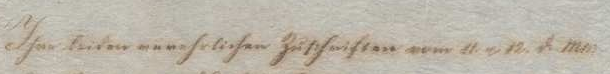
Ihre beiden verehrlichen Zuschriften vom 11. & 12. d. Mts.
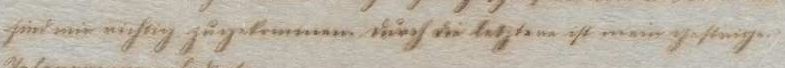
sind mir richtig zugekommen durch die letztere ist mein gestriges
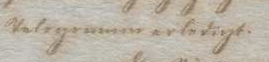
Telegramm erledigt.
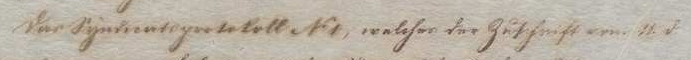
Das Syndicatsprotokoll No 1, welches der Zuschrift vom 11 d.
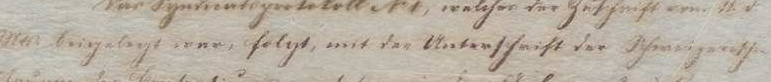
Mts. beigelegt war, folgt, mit der Unterschrift der Schweizerischen
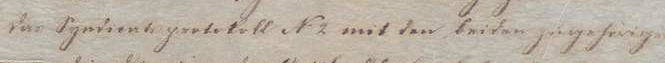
Das Syndicatsprotokoll No 2 mit den beiden zugehörigen
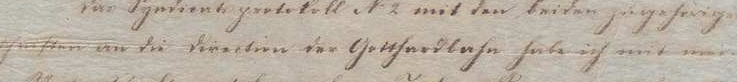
Zuschriften an die Direction der Gotthardbahn habe ich mit mei-
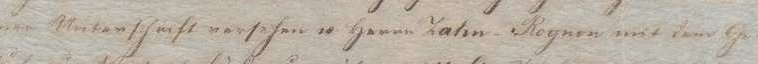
ner Unterschrift versehen & Herrn Zahn-Rognon mit dem Ge-
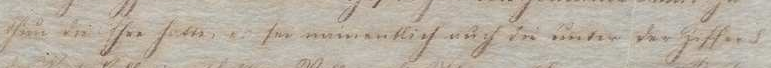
thun die Ehre hatte, es sei namentlich auch die unter der Ziffer 8
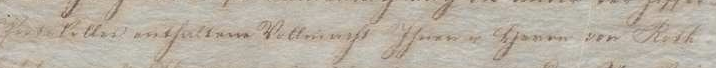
Protokolles enthaltene Vollmacht Ihnen & Herrn von Roth-
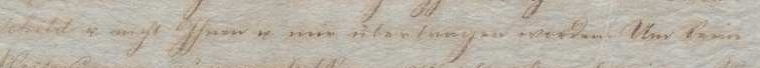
schild & nicht Ihnen & mir übertragen worden. Um keine
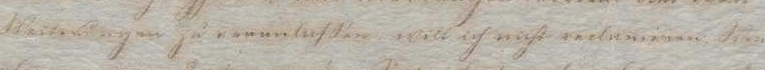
Weiterungen zu veranlaßen, will ich nicht reclamiren. Wenn
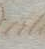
werden
